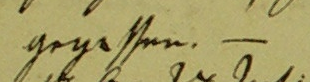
gegeßen.-
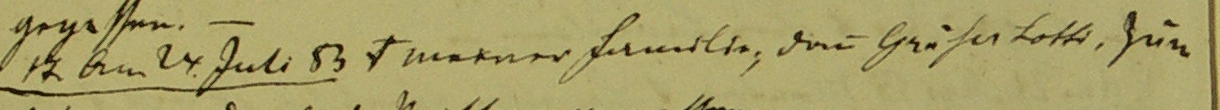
17) Am 24. Juli 83. Mit meiner Familie, dann Gräser Lotti, zum
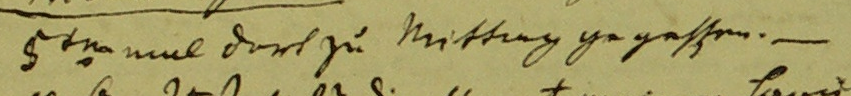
5.ten mal dort zu Mittag gegeßen.
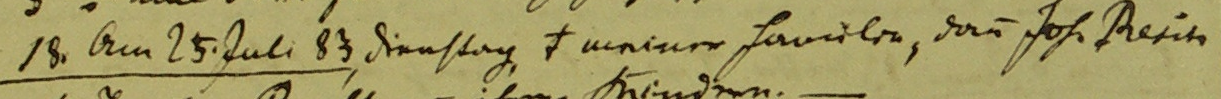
18) Am 25. Juli 83, Dienstag mit meiner Familie ; dann Josef Resch-
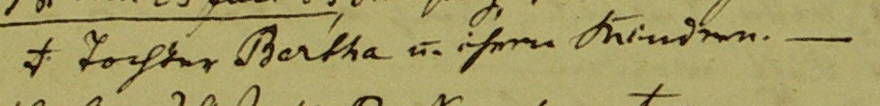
mit Tochter Bertha und ihren Kindern.—
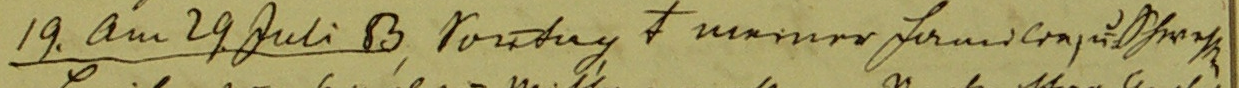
19) Am 29. Juli 83, Sonntag ,mit meiner Familie und Schwester
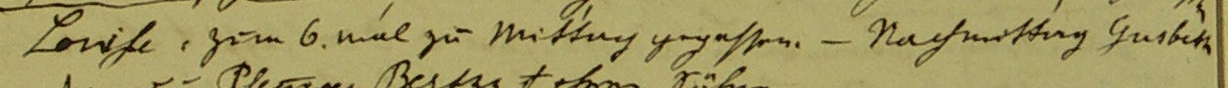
Louise, zum 6. mal zu Mittag gegeßen.- Nachmittag Gusbeth
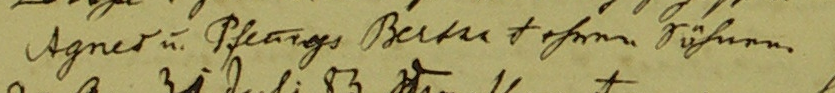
Agnes und Pfenniges Bertha mit ihren Söhnen.
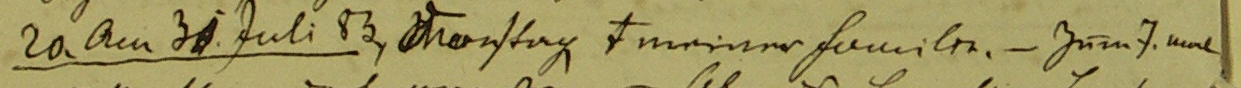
20) Am 31.Juli 83, Samstag mit meiner Familie. - zum 7.mal
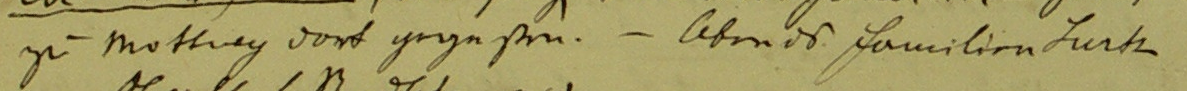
zu Mittag dort gegeßen.- Abends Familien Lurtz
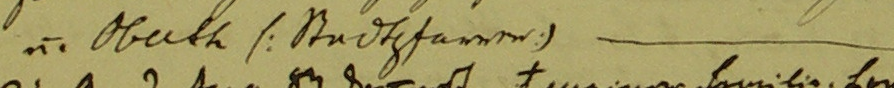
und Oberth (: Stadtpfarrer :) ---
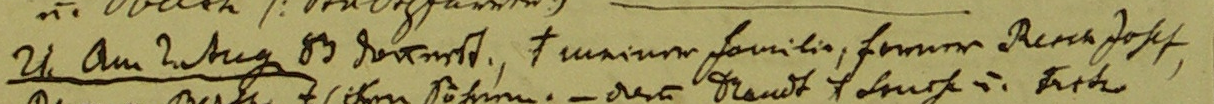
21) Am 2. Aug. 83, Donnerstag, mit meiner Familie; ferner Resch Josef,
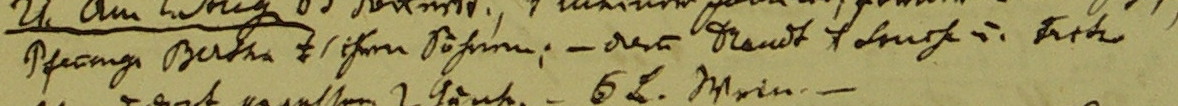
Pfenniges Bertha mit ihren Söhnen;- dann Draudt mit Louise und Fritz
